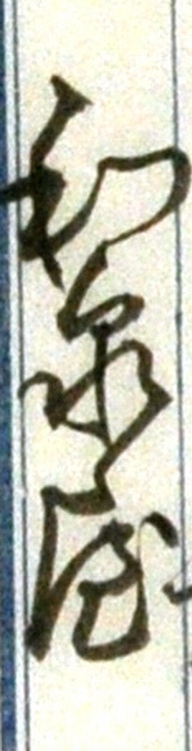和泉屋
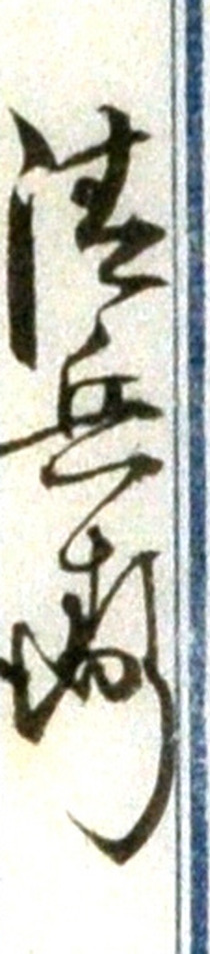清兵衛
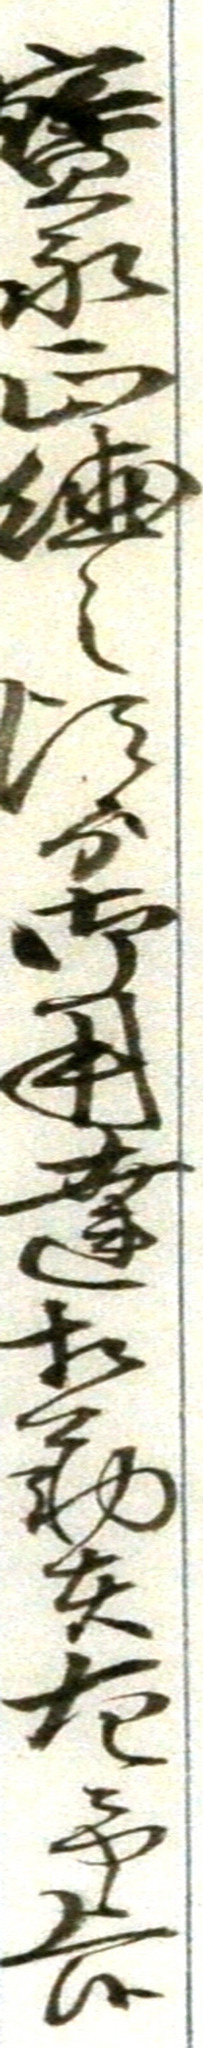宝永正徳之頃ゟ御用達相勤者左ニ申上候
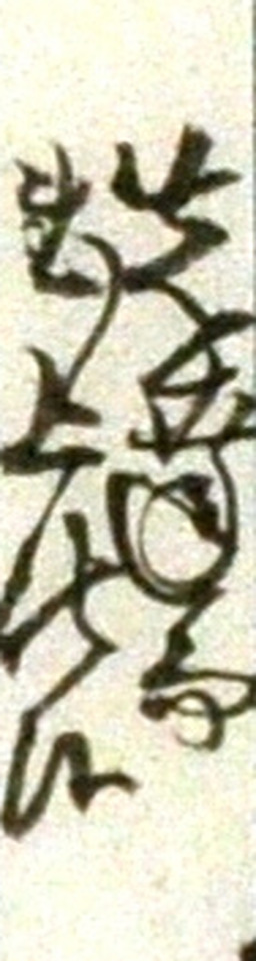書上仕候
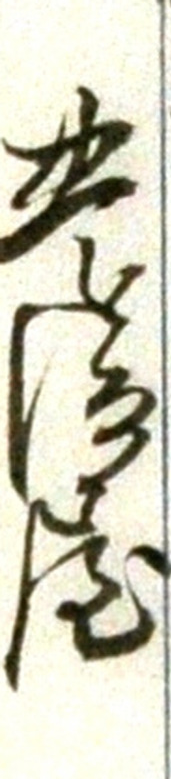豊後屋
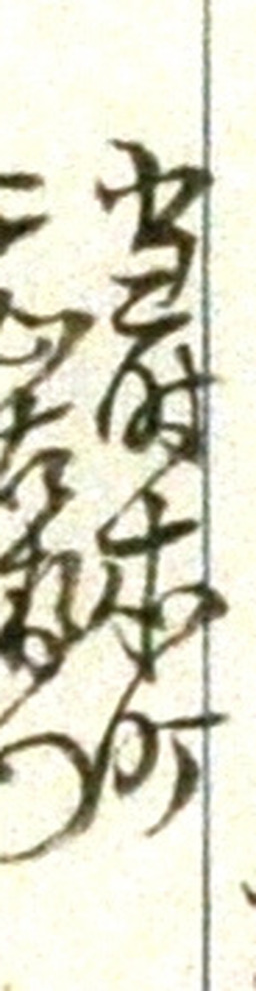甚右衛門
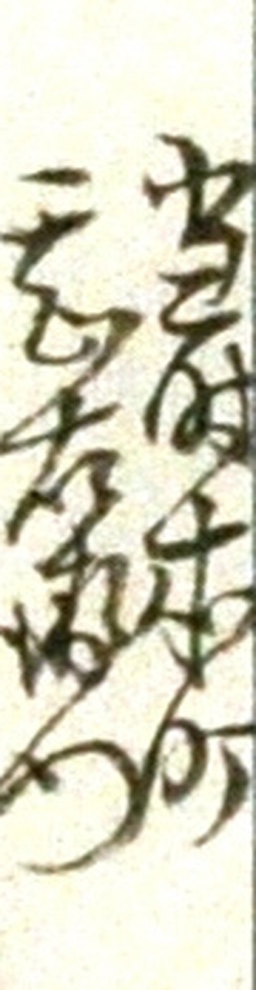甚右衛門
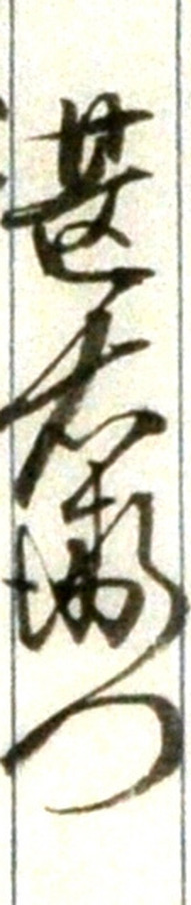甚右衛門
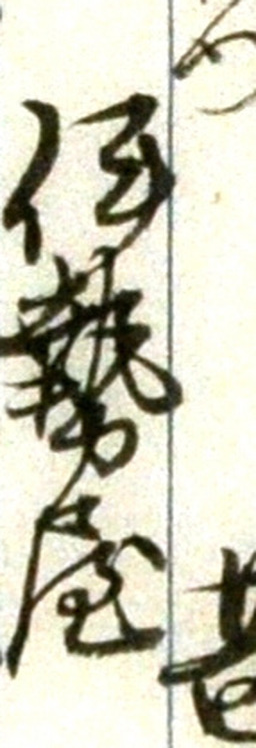伊勢屋
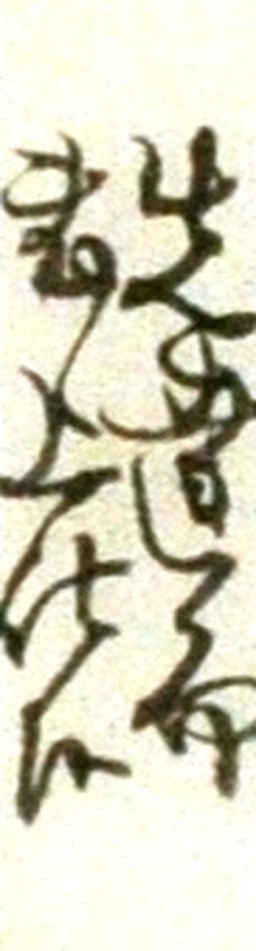書上仕候
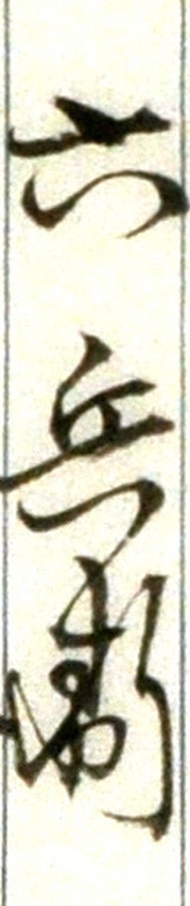清兵衛
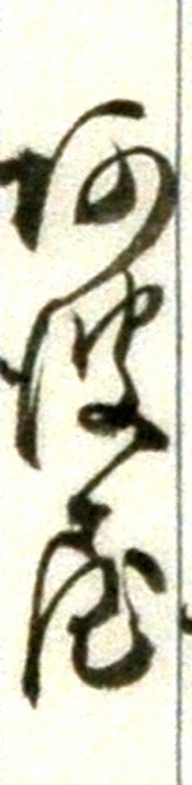阿波屋
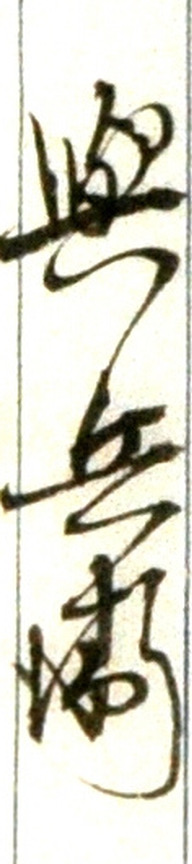清兵衛

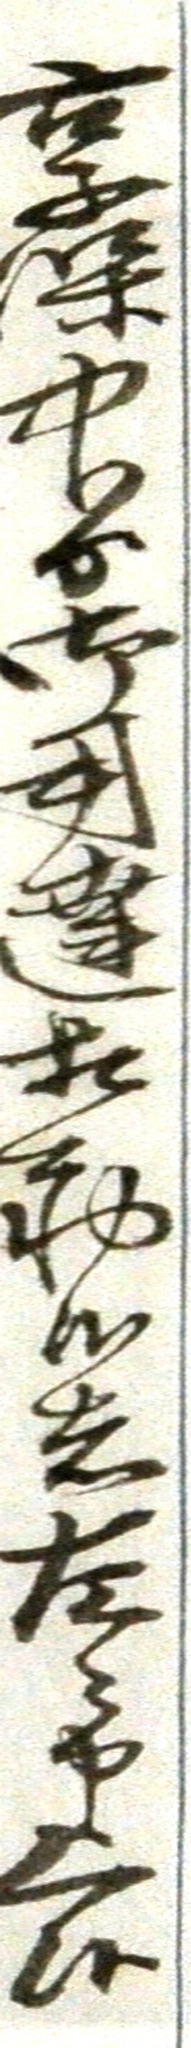享保中ゟ御用達相勤候者左ニ申上候
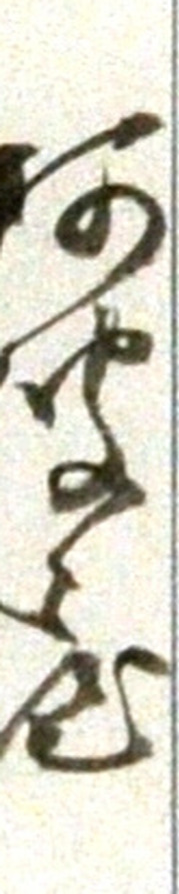阿波屋
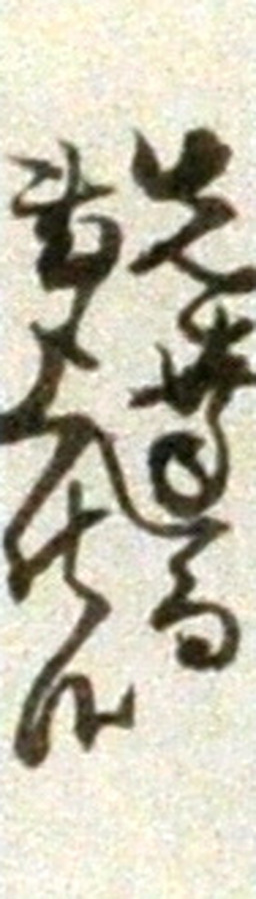書上仕候
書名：御拝地以来御用達相勤候者名前
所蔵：伊那市立高遠町図書館・合同会社AMANE
